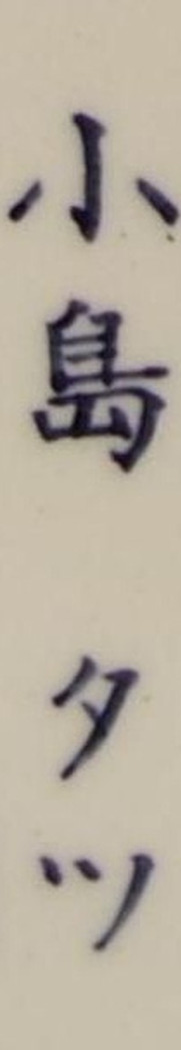小島タツ
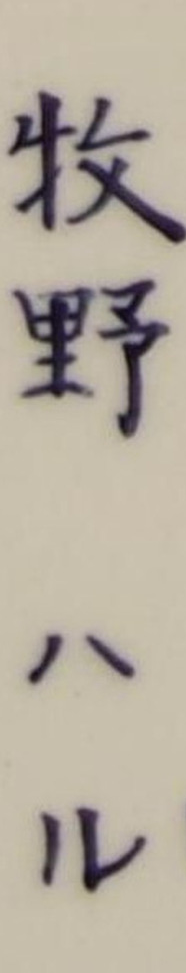牧野ハル
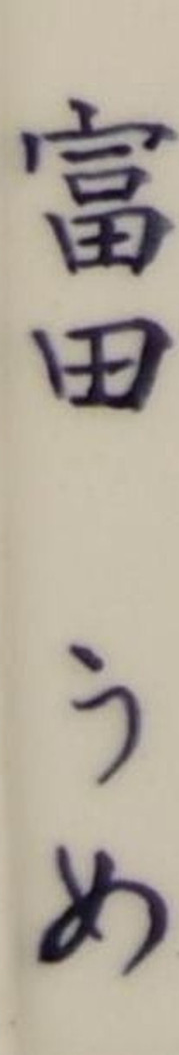富田うめ

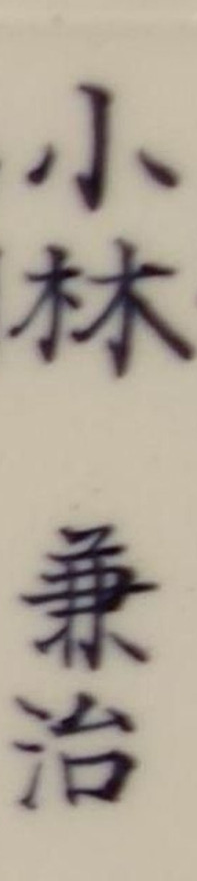小林兼治
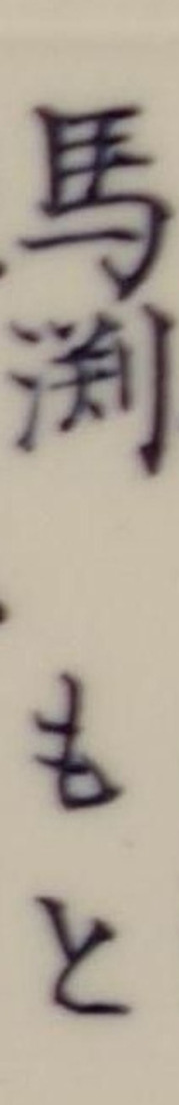馬渕もと
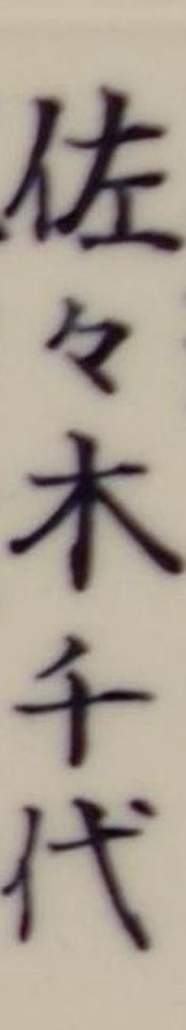佐々木千代
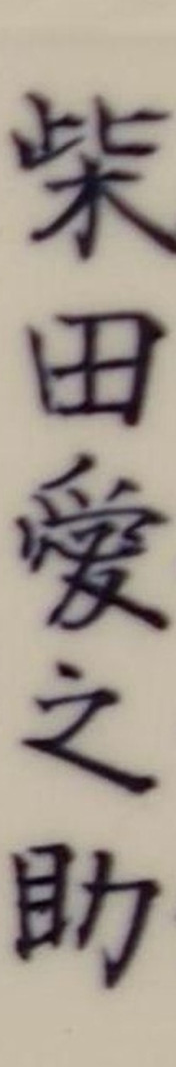柴田愛之助
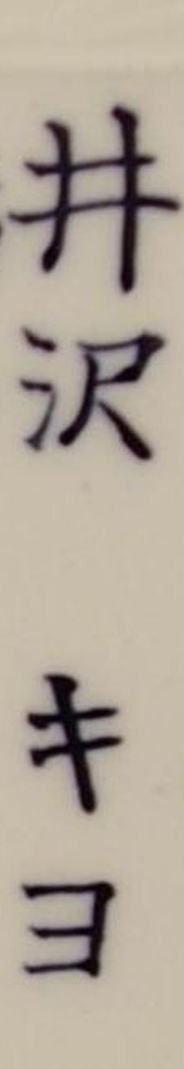井沢キヨ
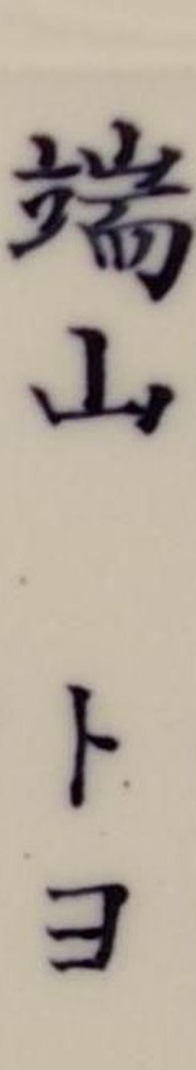端山トヨ
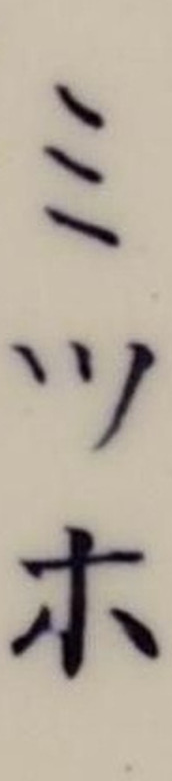ミツホ
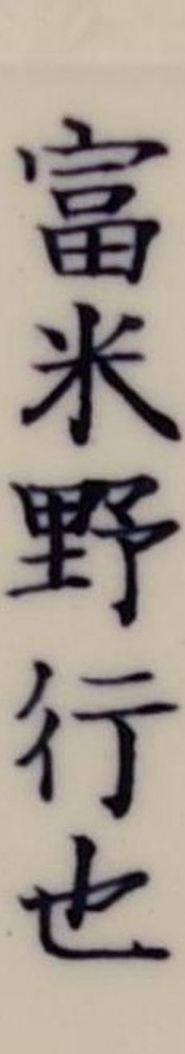富米野行也
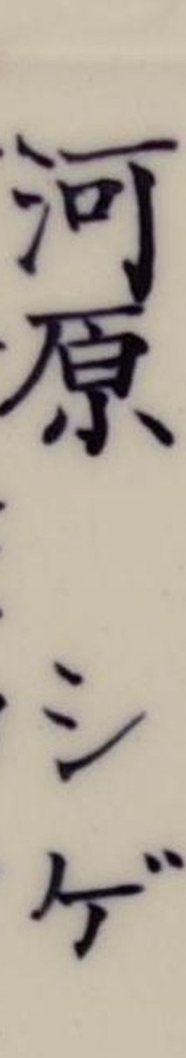河原シゲ
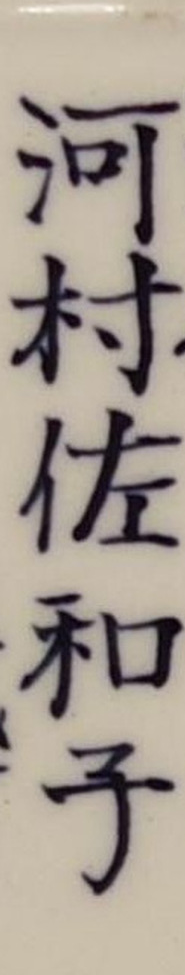河村佐和子
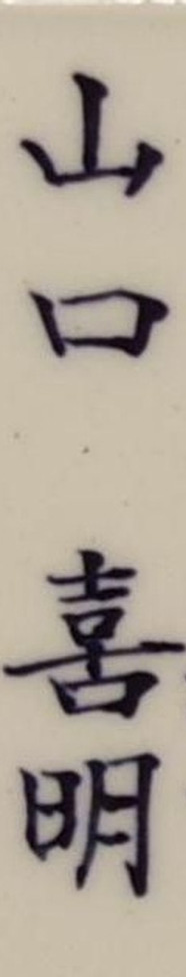山口喜明
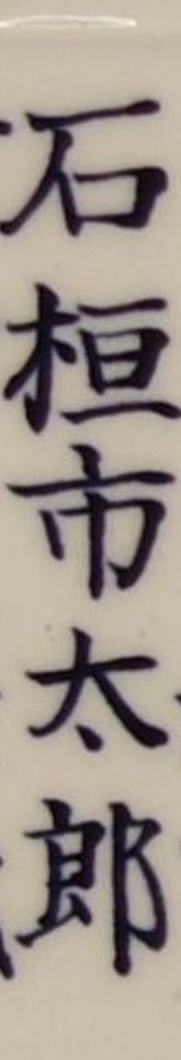石垣市太郎
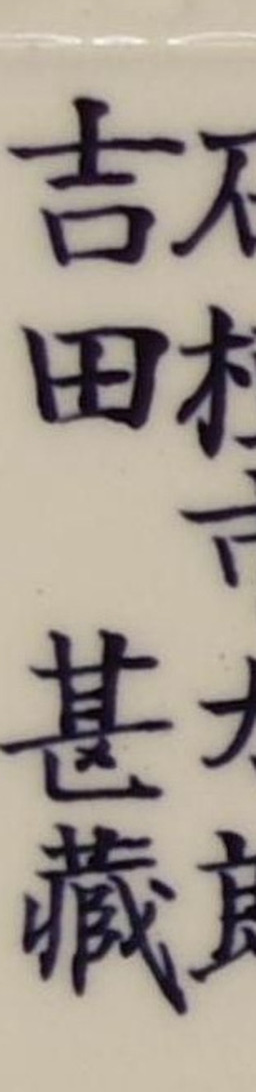吉田甚蔵
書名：M~S
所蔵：高野山金剛峯寺
